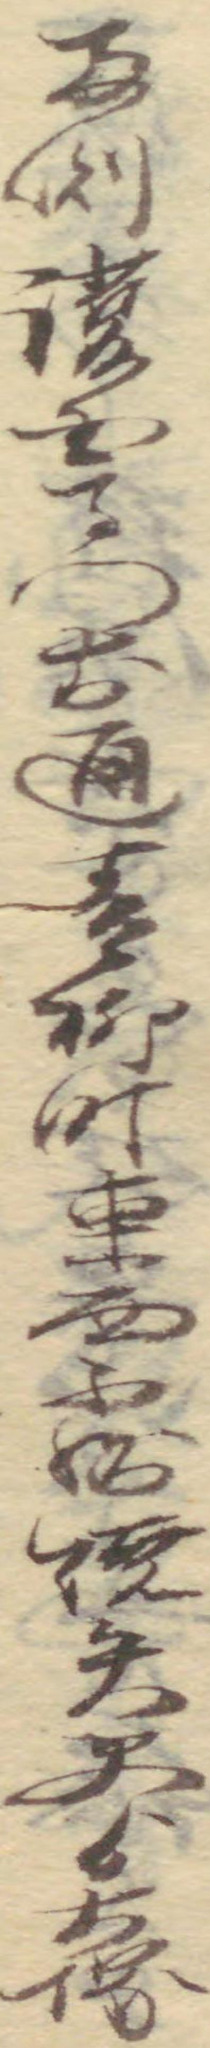両側護国寺門前通青柳町東西不残焼失夫ゟ大塚
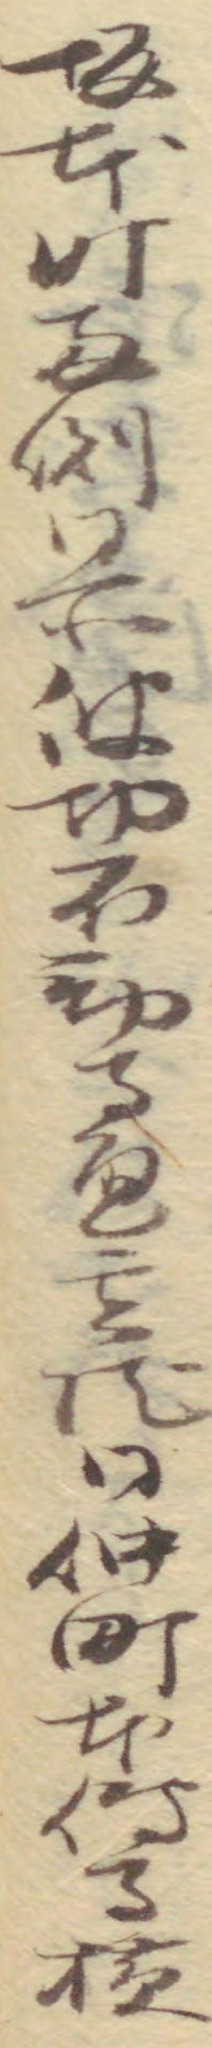坂本町両側同所波功不動寺通玄院同仲町本伝寺横
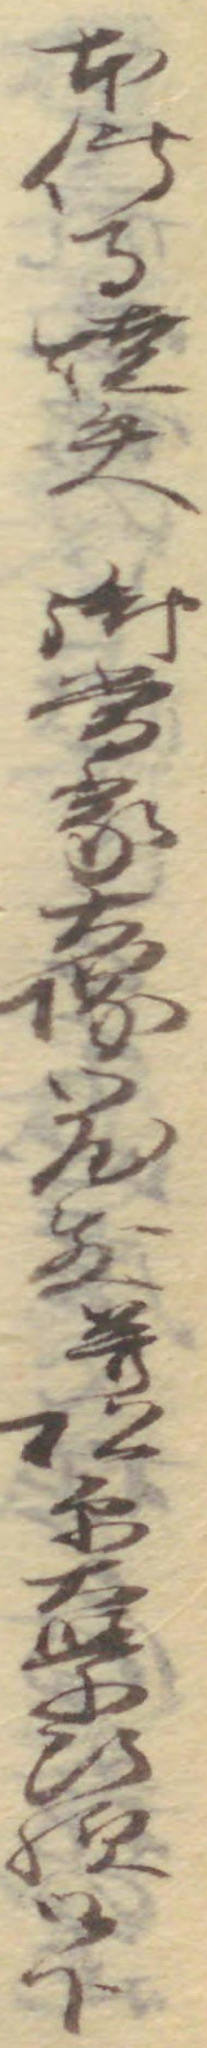本伝寺焼失御当家大塚御屋敷幷松平大学頭様御下
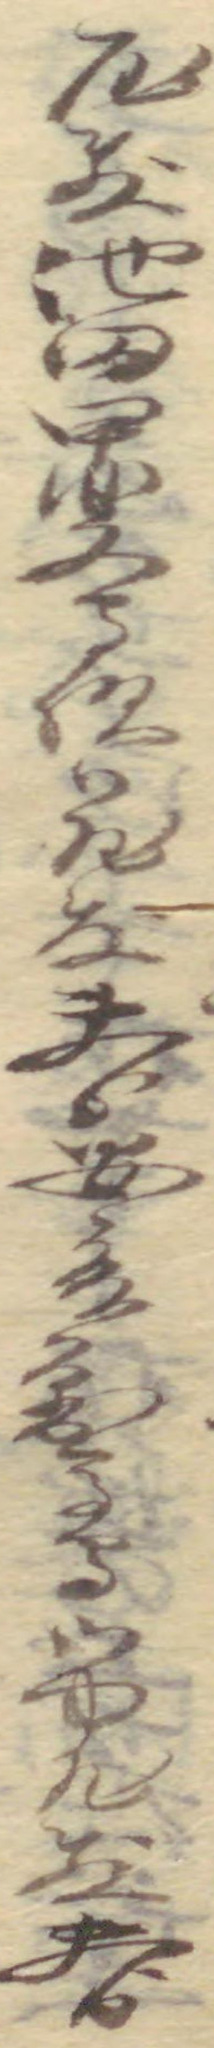屋敷池田甲斐守様御屋敷夫ゟ安藤対馬守御中屋敷夫ゟ
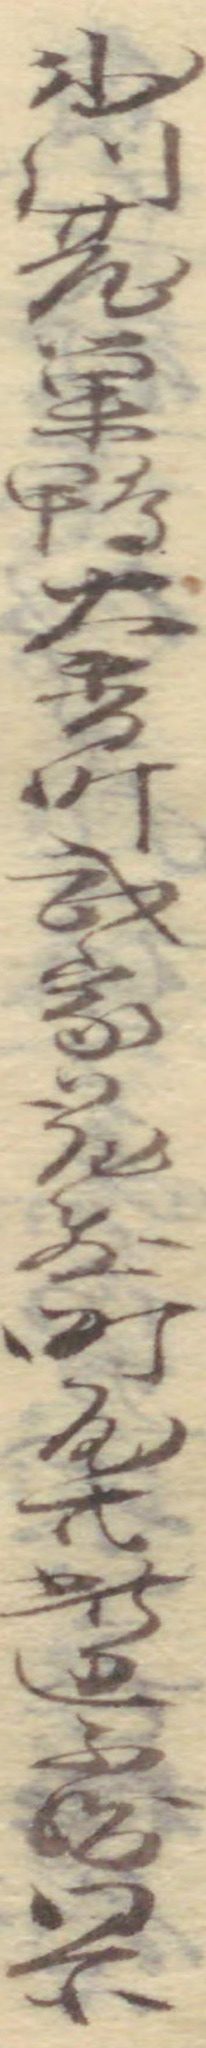氷川台巣鴨火番町武家御屋敷町屋共此辺不残同所
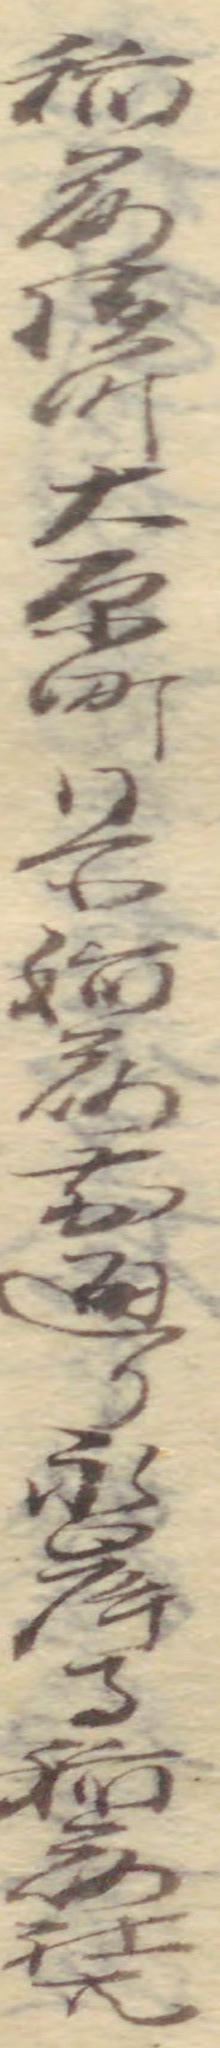稲荷横町大原町同所稲荷前通り永岸寺稲荷社共
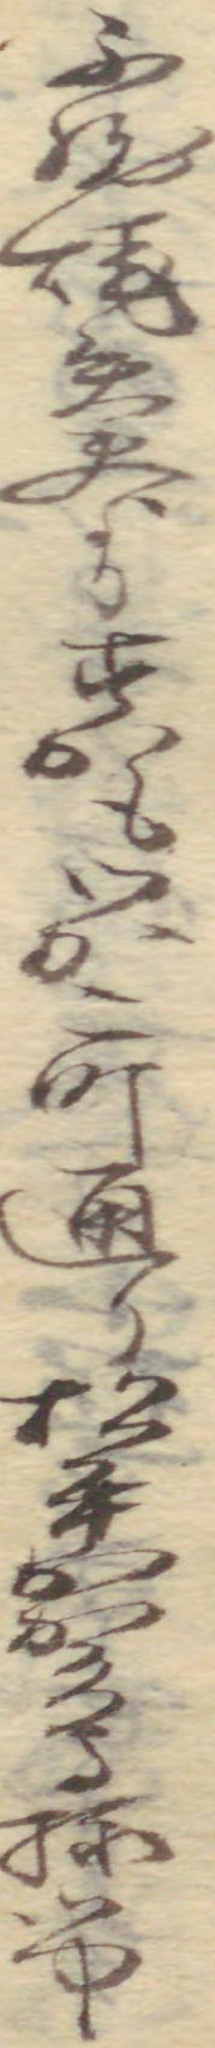不残焼失夫よりすかも御かこ町通り松平加賀守様御中
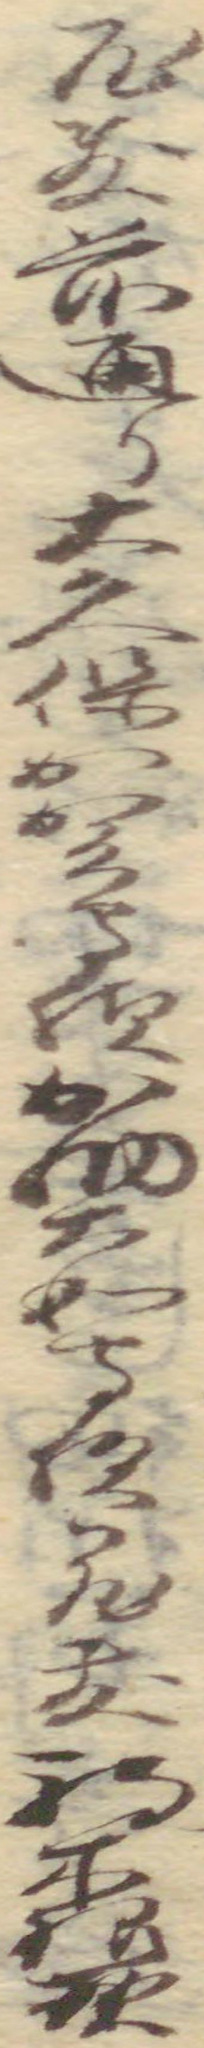屋敷前通り大久保加賀守様加納大和守様御屋敷駒木根様
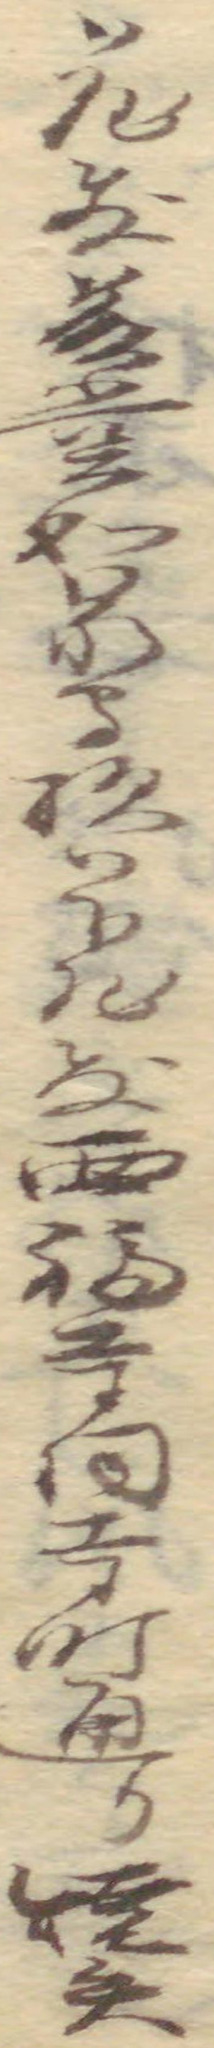御屋敷藤堂和泉守様御下屋敷西福寺向寺町通り焼失
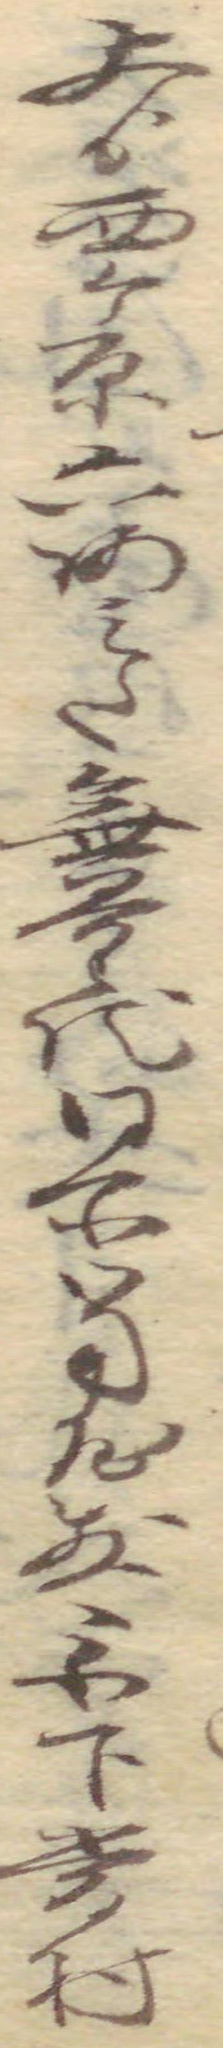夫ゟ西ケ原六あミた無量院同所御用屋敷宮下当村
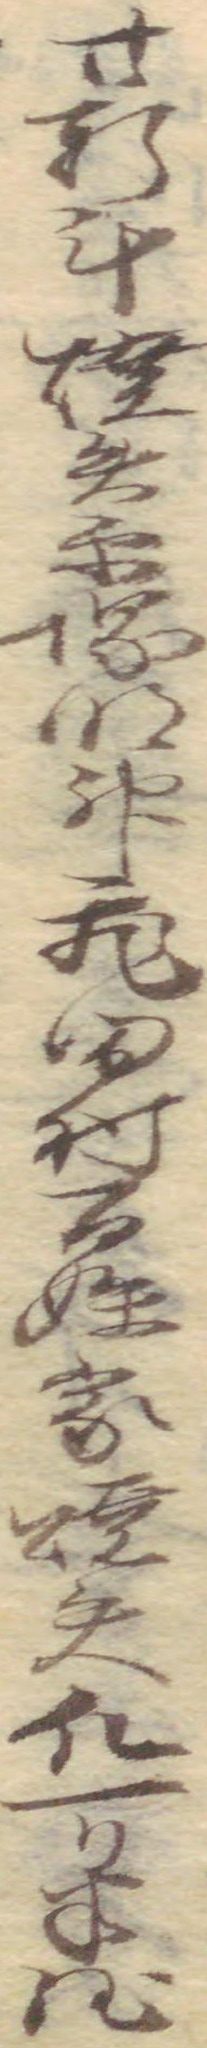廿軒斗焼失平塚明神飛田村百姓家焼失凡一り半程
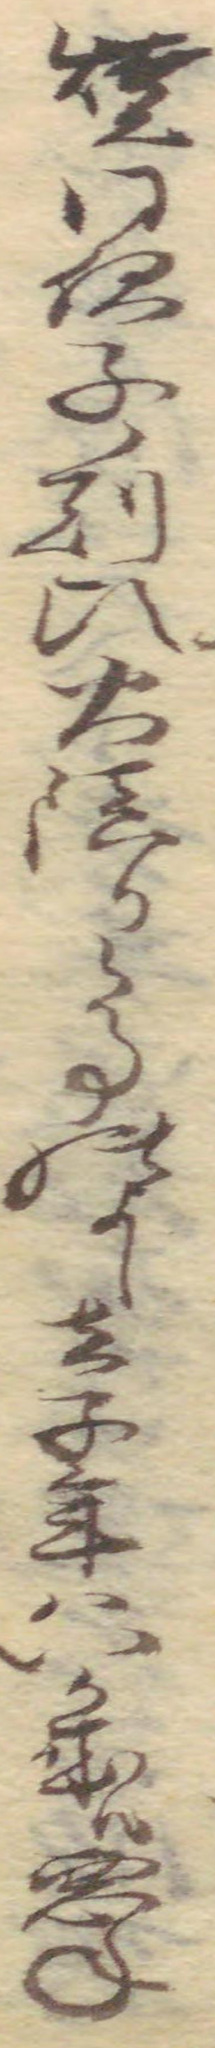焼同夜子ノ刻頃火鎮り候事のよし去子年ハいか成ル悪年
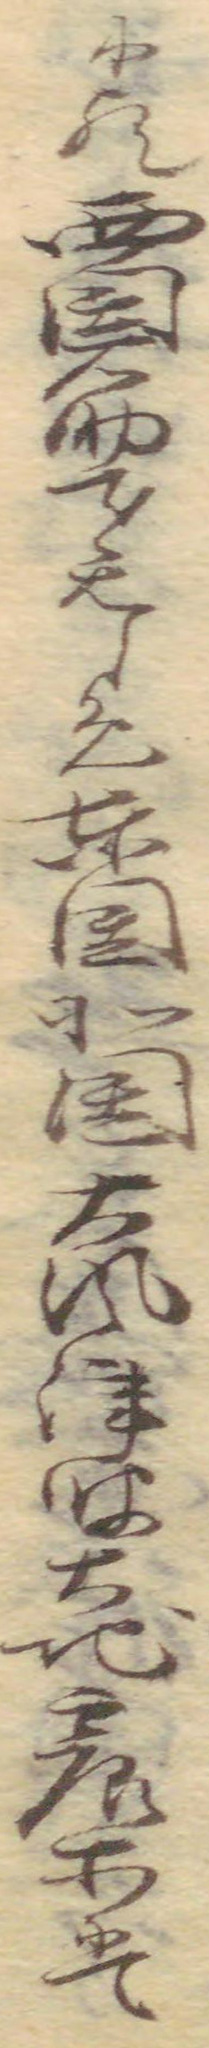に歟西国筋をはしめ東国北国大風津波大地震等にて

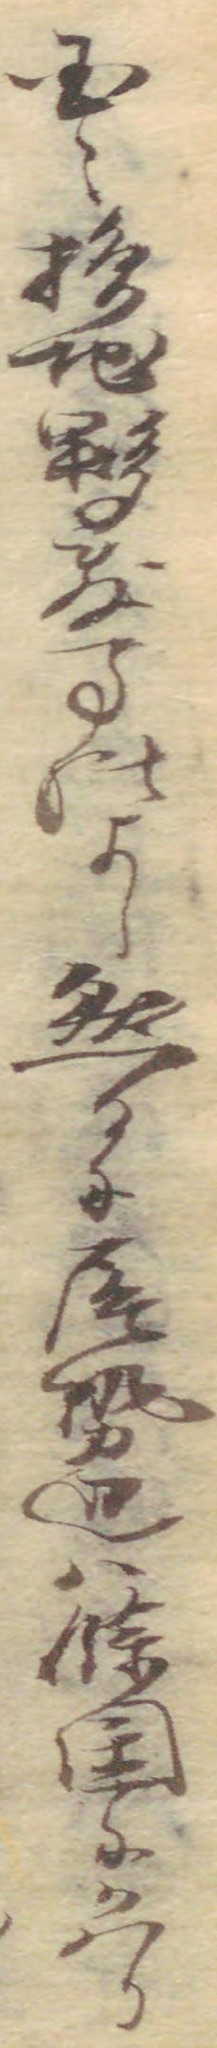国々損地夥敷事のよし然るに尾勢辺ハ餘国にかハり
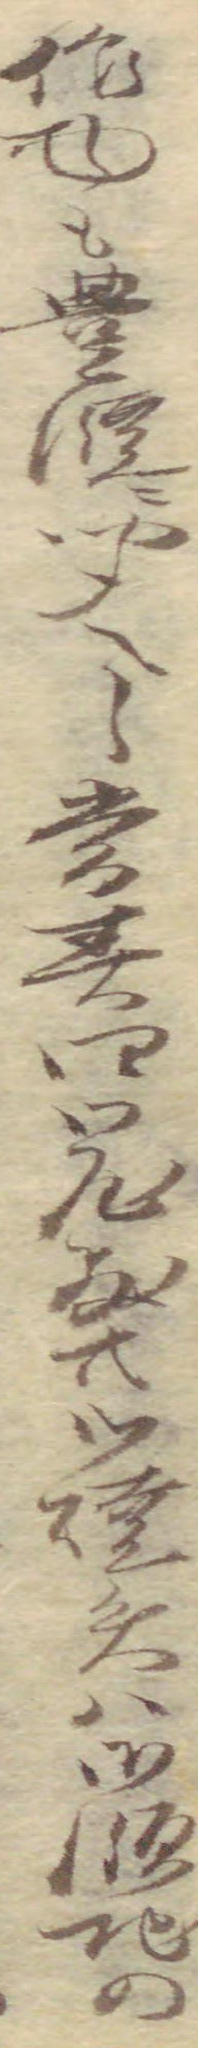作物も豊饒ニ聞へ候当春四御屋敷共御焼失ハ御領地の
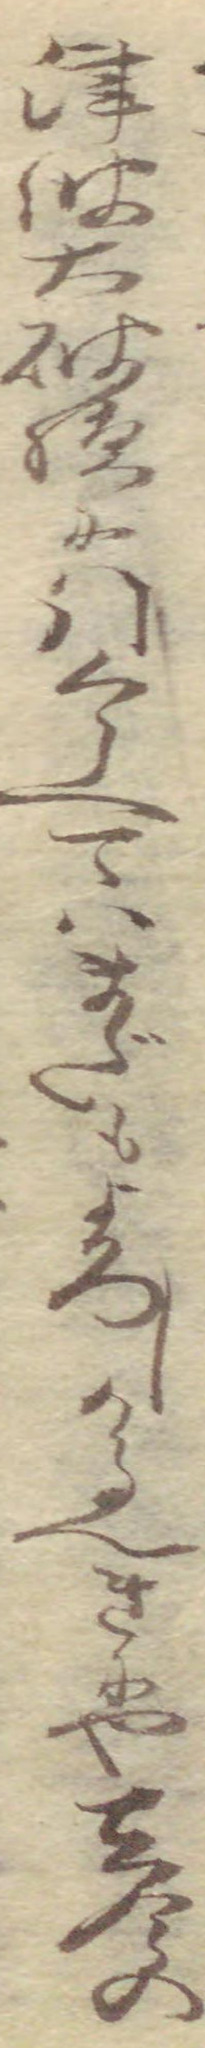津波大破損にハ引くらへてハまだしもよろしかるへきにや去今の
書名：鶯宿雑記. 巻199-200
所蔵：国立国会図書館 National Diet Library, JAPAN
